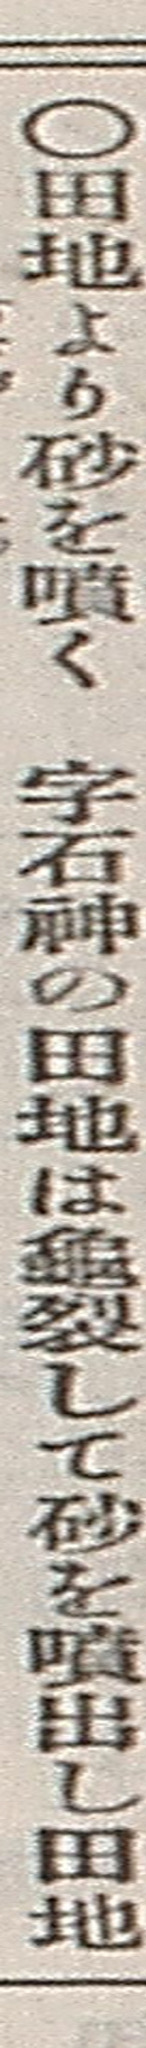〇田地より砂を噴く字石神の田地は亀裂して砂を噴出し田地
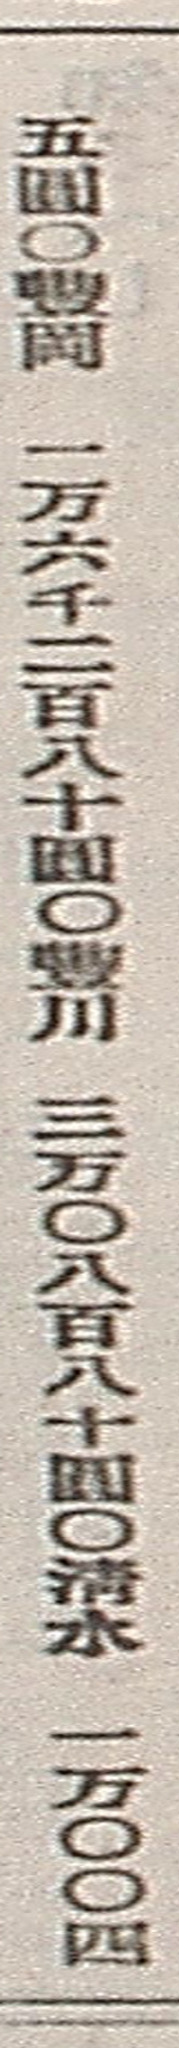五円〇豊岡一万六千二百八十円〇豊川三万〇八百八十円〇清水一万〇〇四
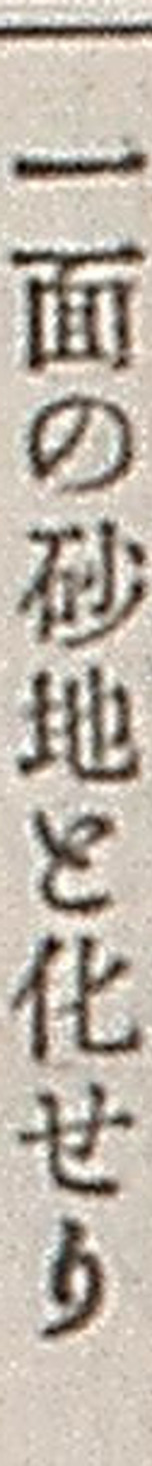一面の砂地と化せり
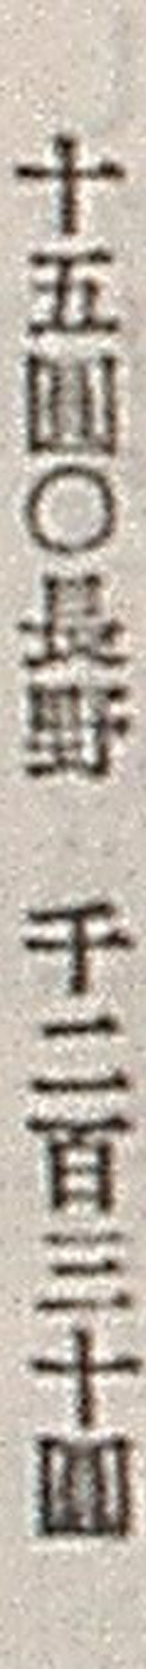十五円〇長野千二百三十円
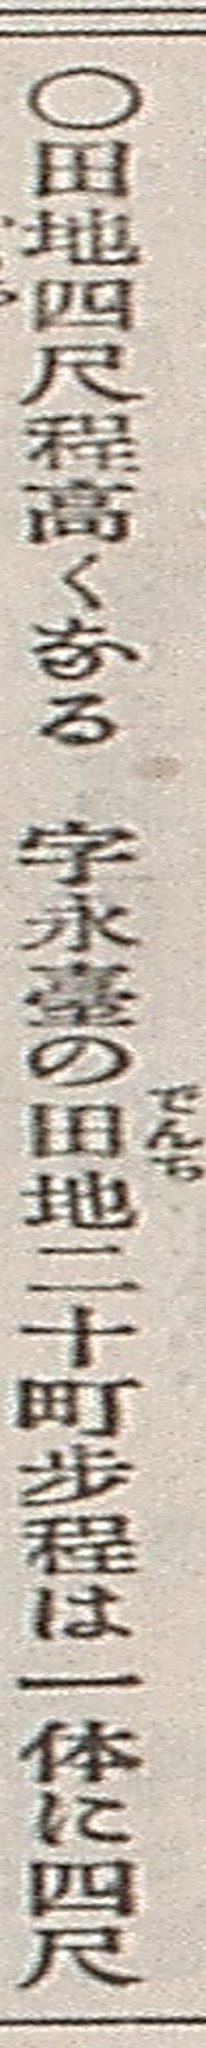〇田地四尺程高くなる字永台の田地二十町歩程は一体に四尺
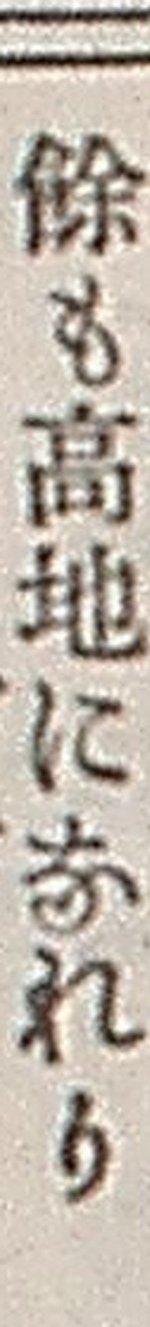余も高地になれり
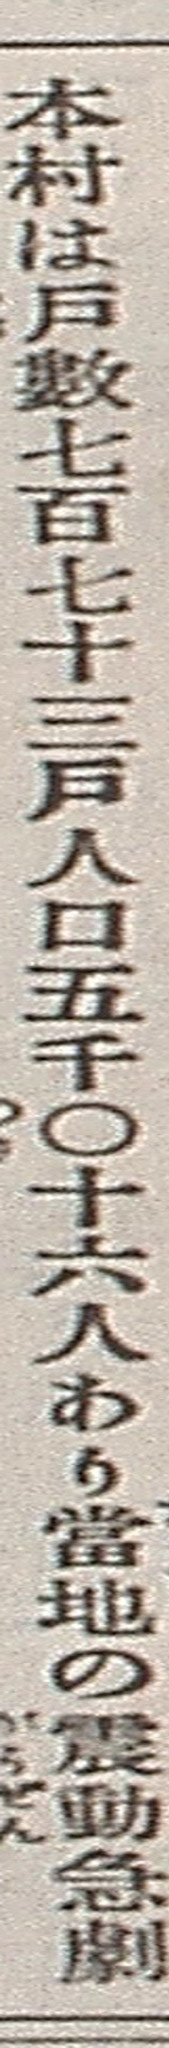本村は戸数七百七十三戸人口五千〇十六人あり当地の震動急劇
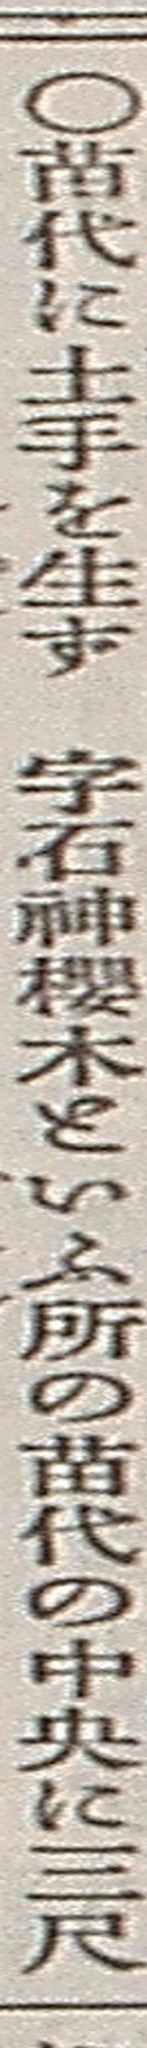〇苗代に土手を生ず字石神桜木といふ所の苗代の中央に三尺
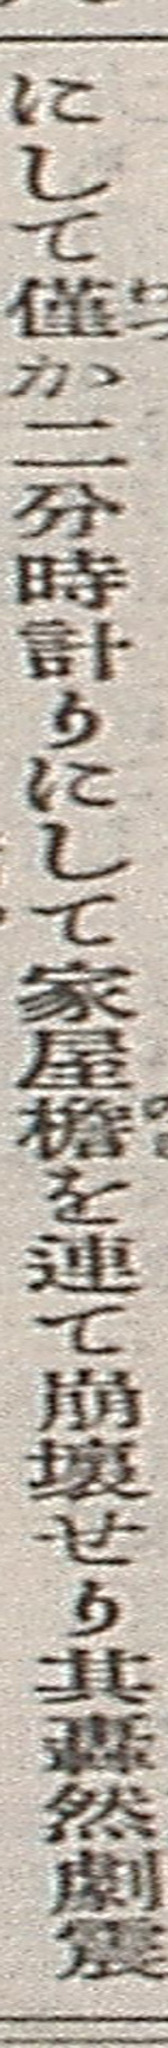にして僅か二分時計りにして家屋檐を連て崩壊せり其轟然劇震
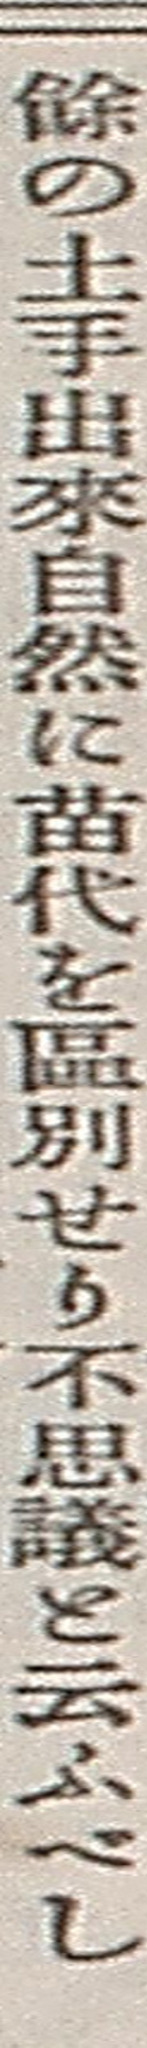余の土手出来自然に苗代を区別せり不思議と云ふべし
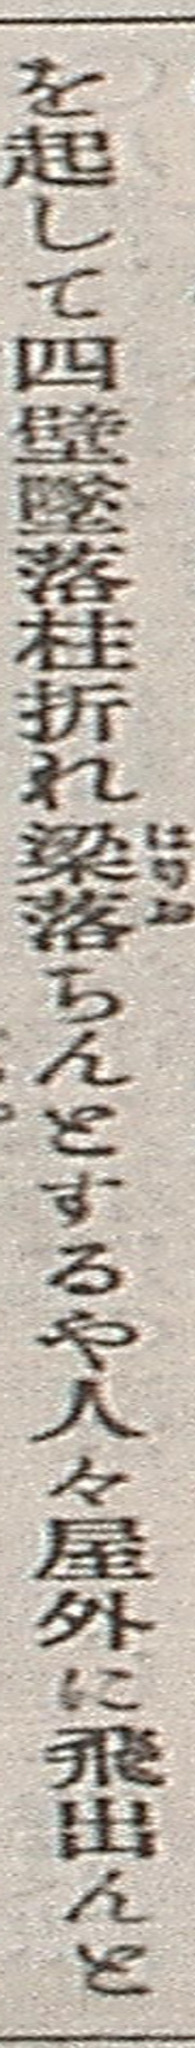を起して四壁墜落柱折れ梁落ちんとするや人々屋外に飛出んと
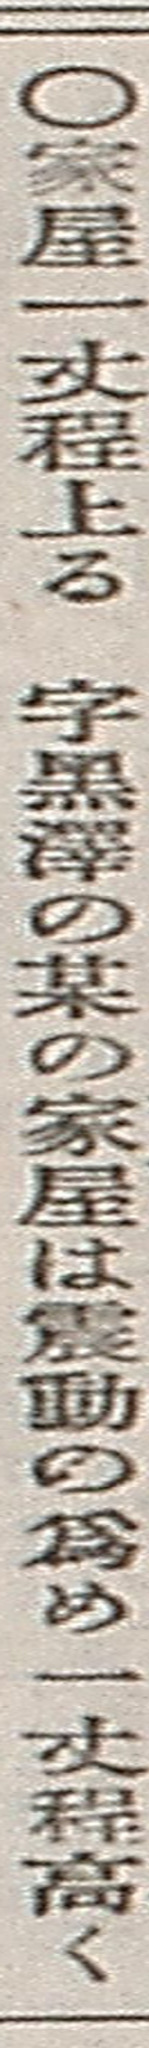〇家屋一丈程上る字黒沢の某の家屋は震動の為め一丈程高く
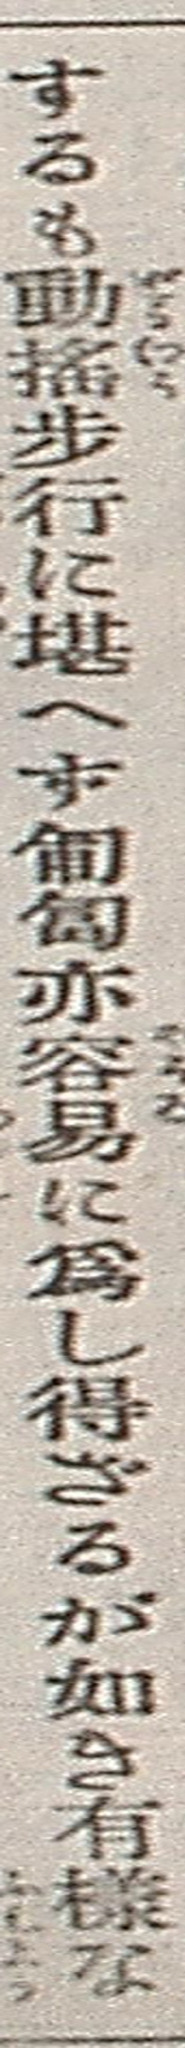するも動揺歩行に堪へず匍匐亦容易に為し得ざるが如き有様な
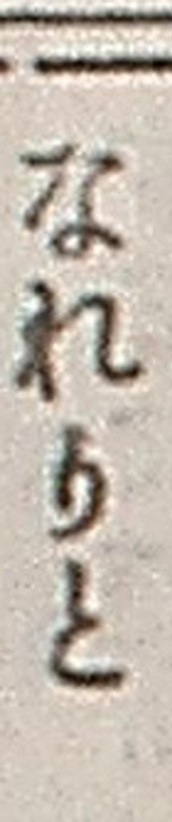なれりと
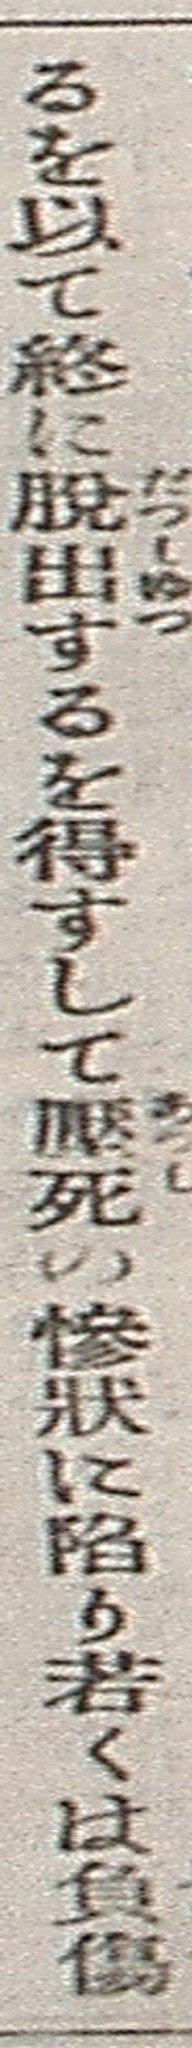るを以て終に脱出するを得すして圧死の惨状に陥り若くは負傷

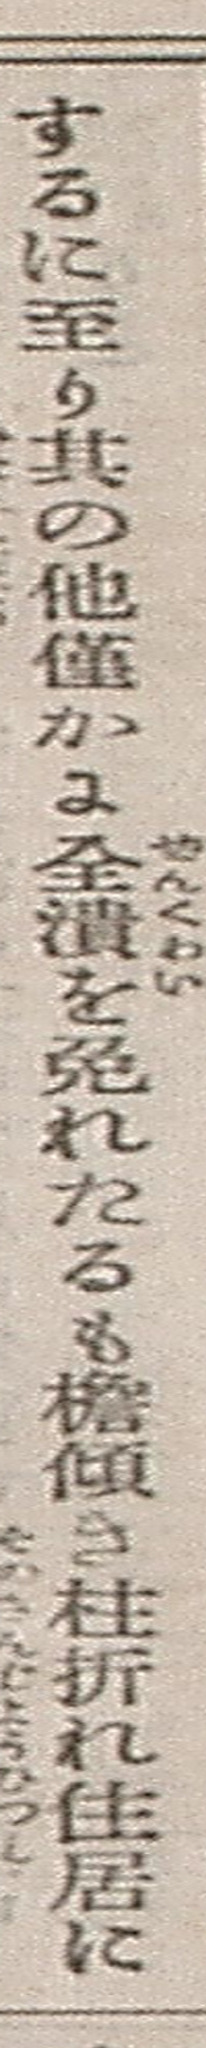するに至り其の他僅かに全潰を免れたるも檐傾き柱折れ住居に
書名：風俗畫報臨時増刊第百二十四號　洪水地震被害録（上）
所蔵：東京大学地震研究所図書室 Earthquake Research Institute Library, The University of Tokyo, JAPAN
